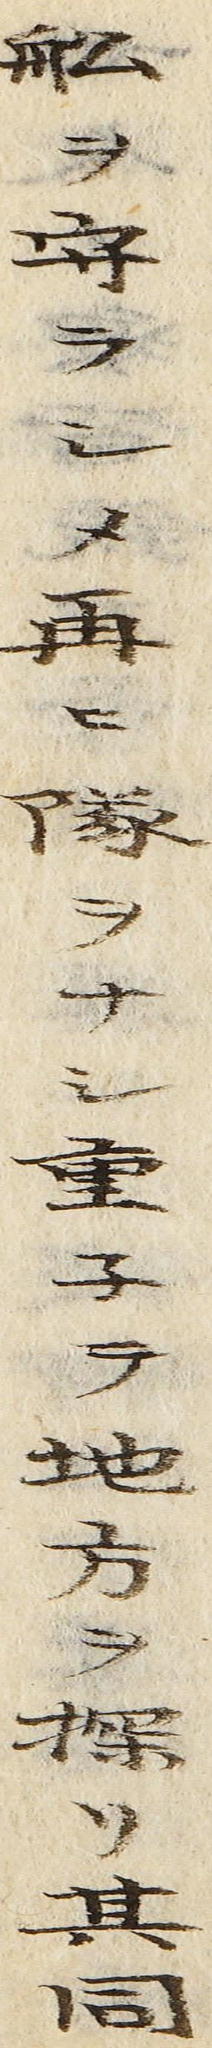船ヲ守ラシメ再ヒ隊ヲナシ重ネテ地方ヲ探リ其同
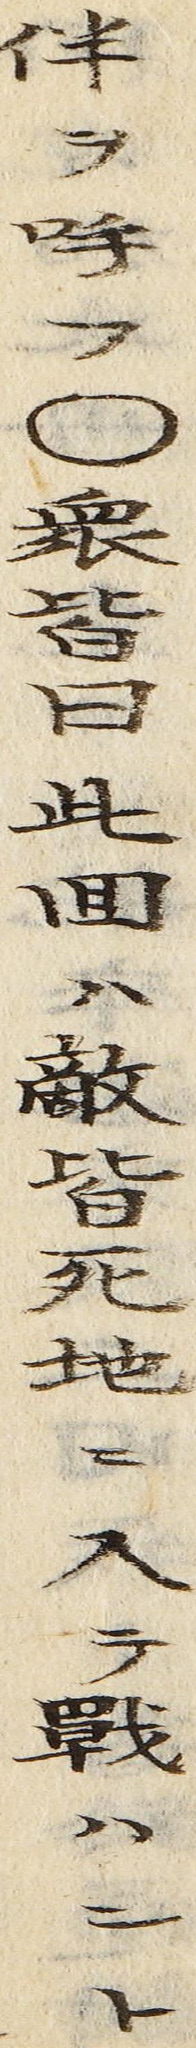伴ヲ呼フ◯衆皆曰此回ハ敵皆死地ニ入テ戦ハント
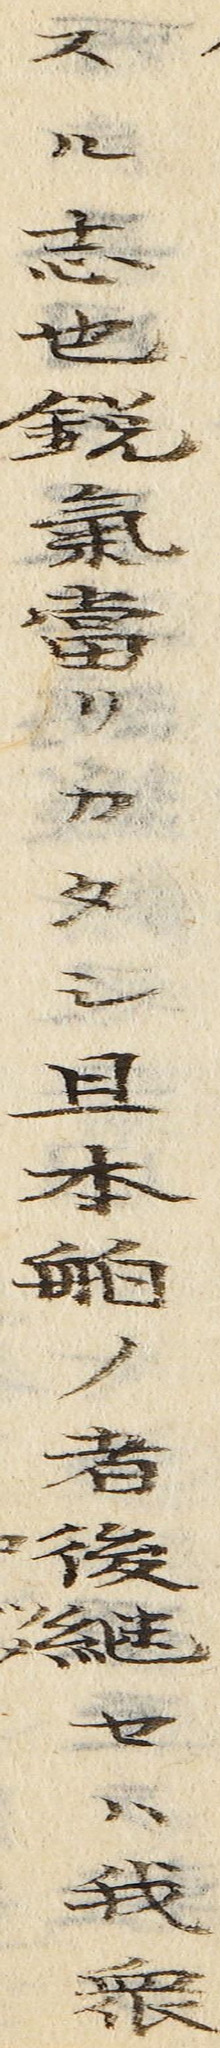スル志也鋭気当リカタシ且本舶ノ者後継セハ我衆
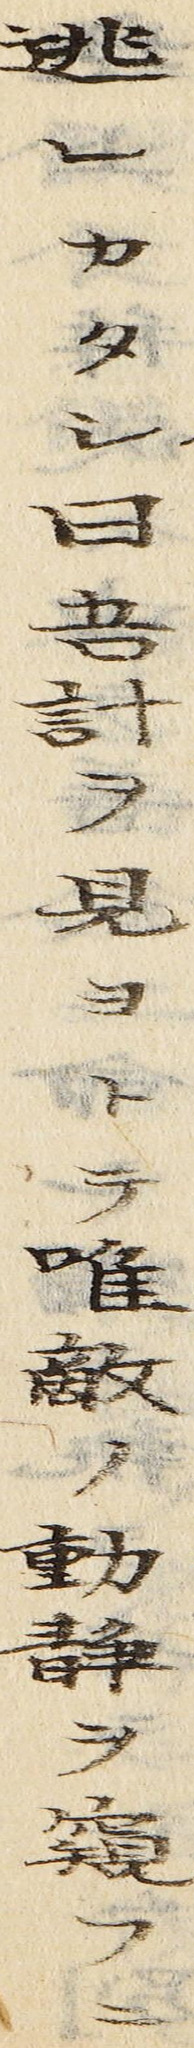逃レカタシ曰吾計ヲ見ヨトテ唯敵ノ動静ヲ窺フニ
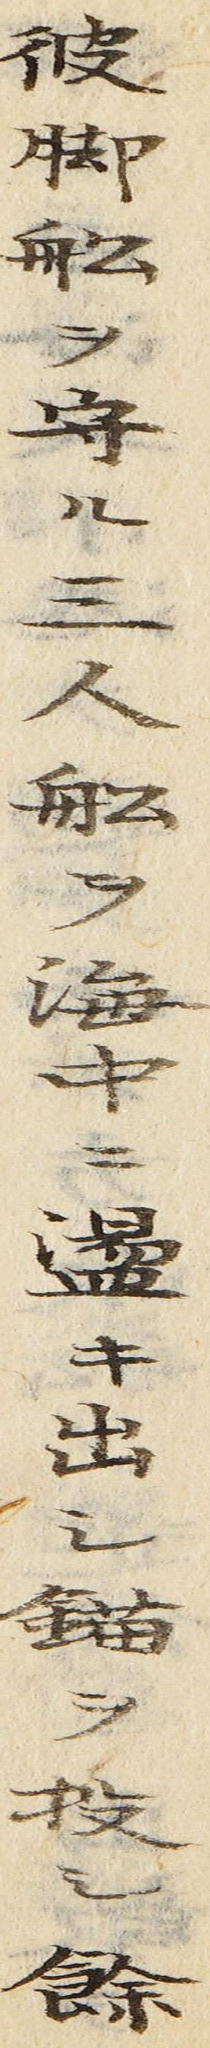彼脚船ヲ守ル三人船ヲ海中ニ盪キ出シ錨ヲ投シ余
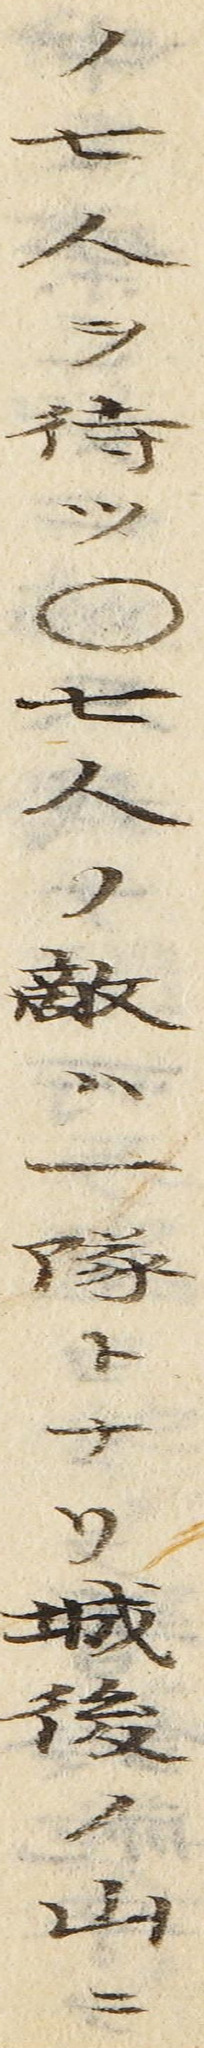ノ七人ヲ待ツ◯七人ノ敵ハ一隊トナリ城後ノ山ニ
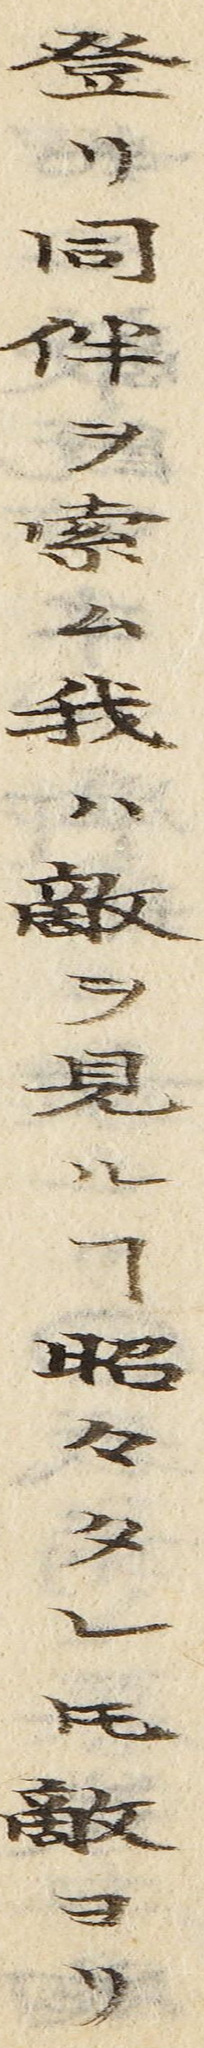登リ同伴ヲ索ム我ハ敵ヲ見ルコト昭々タレトモ敵ヨリ
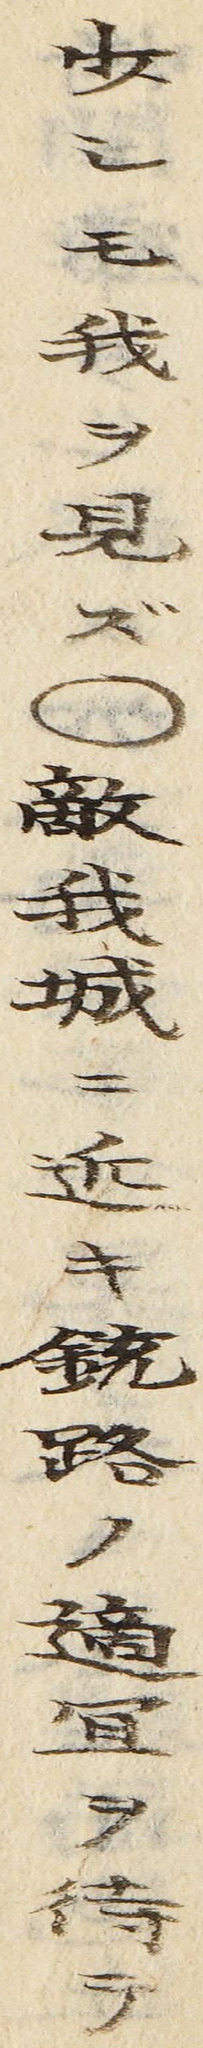少シモ我ヲ見ズ◯敵我城ニ近キ銃路ノ適宜ヲ待テ
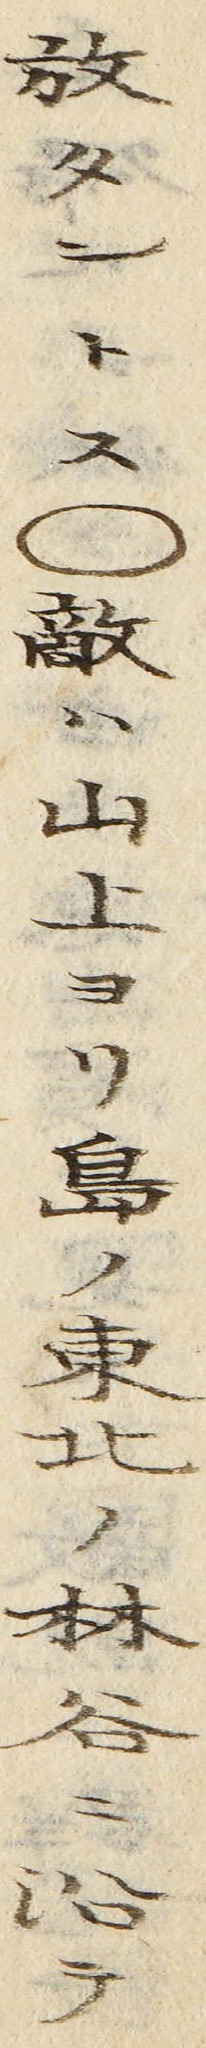放タントス◯敵ハ山上ヨリ島ノ東北ノ林谷ニ沿テ
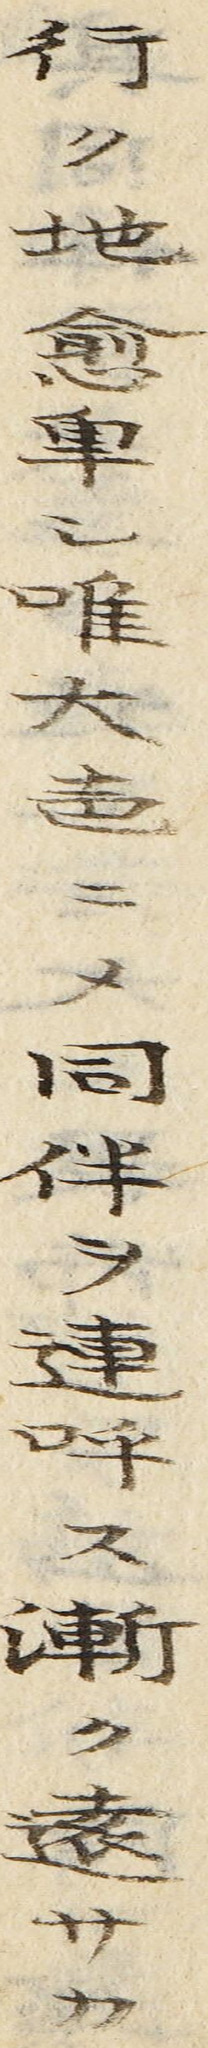行ク地愈卑シ唯大声ニシテ同伴ヲ連呼ス漸ク遠サカ
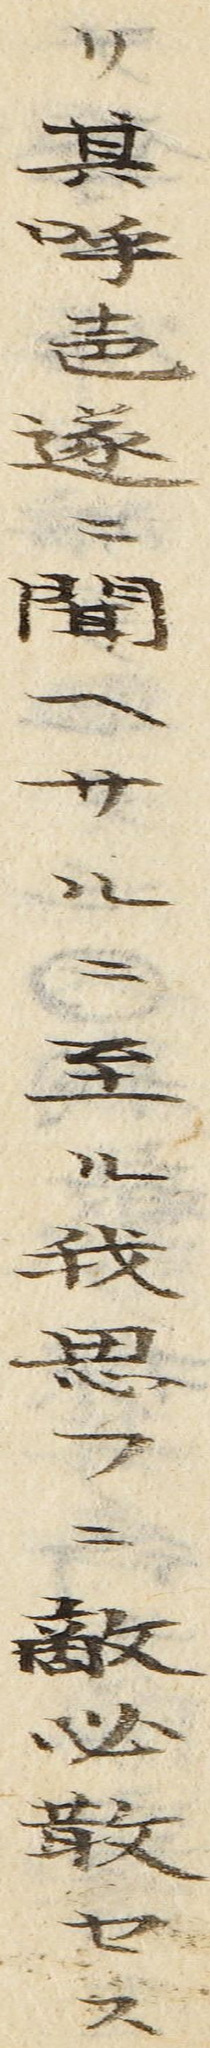リ其呼声遂ニ聞ヘサルニ至ル我思フニ敵必散セス
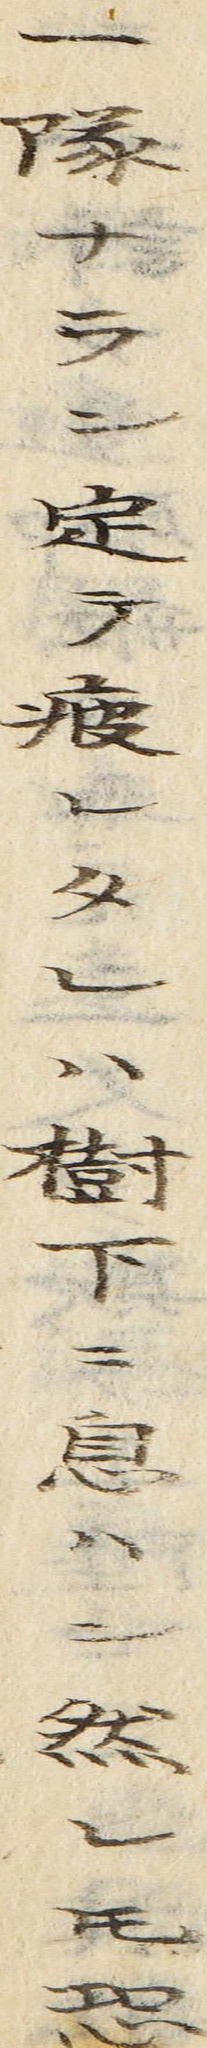一隊ナラン定テ疲レタレハ樹下ニ息ハン然レトモ恐
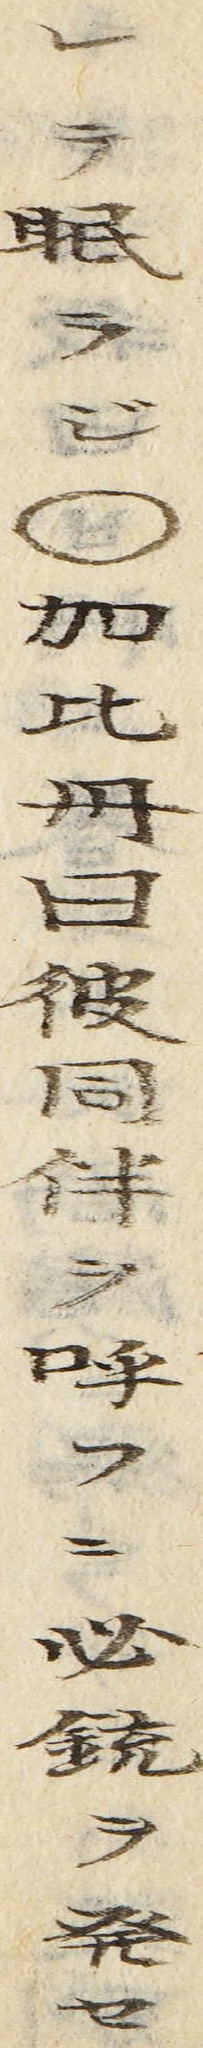レテ眠ラジ◯加比丹曰彼同伴ヲ呼フニ必銃ヲ発セ
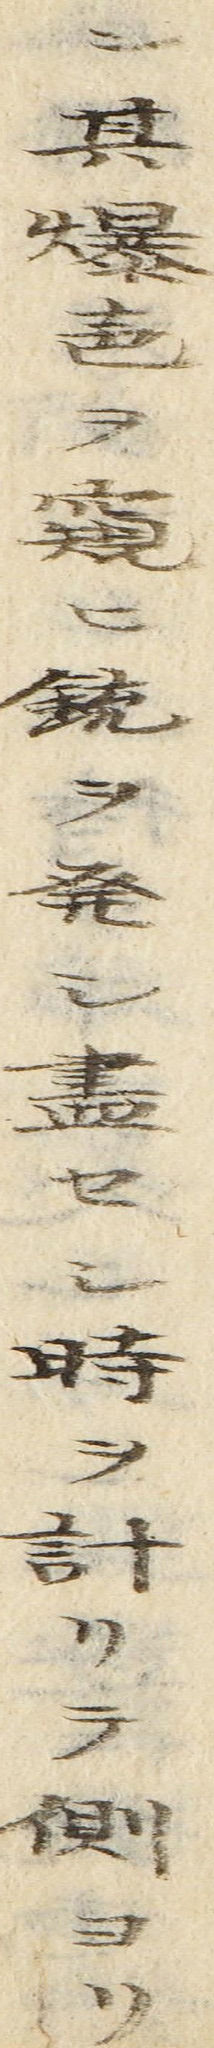ン其爆声ヲ窺ヒ銃ヲ発シ尽セン時ヲ計リテ側ヨリ
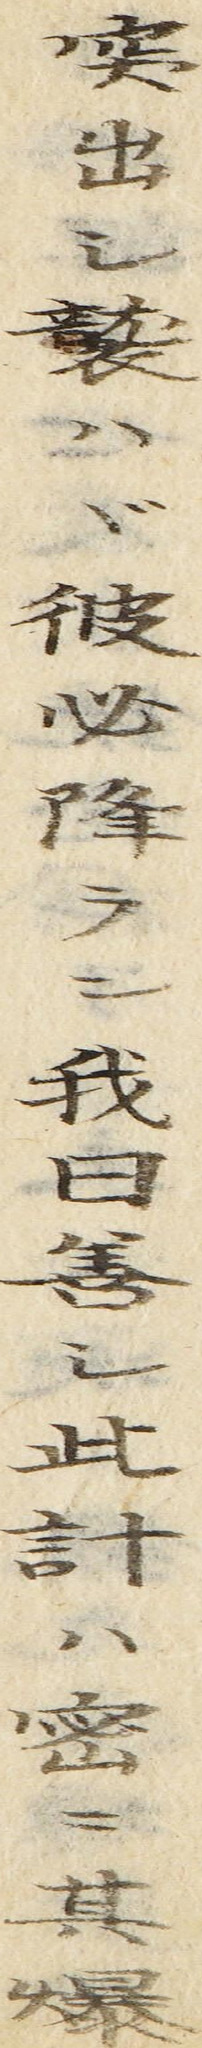突出シ襲ハヾ彼必降ラン我曰善シ此計ハ密ニ其爆

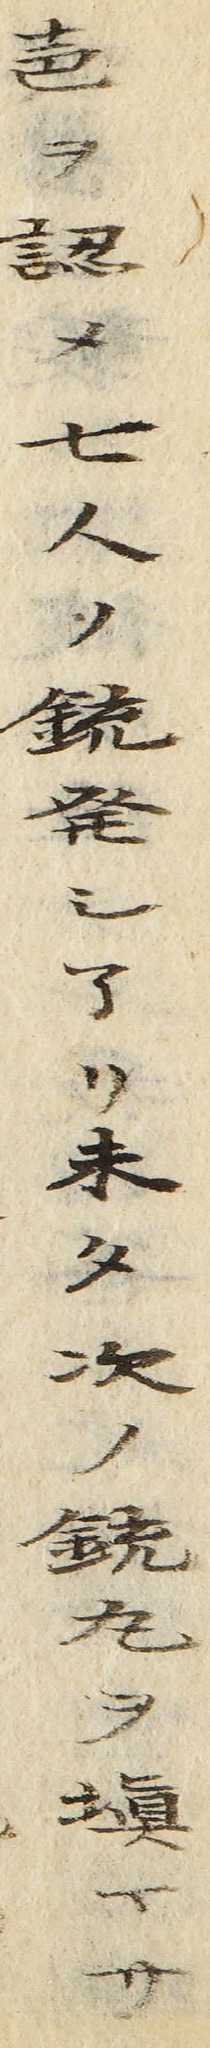声ヲ認メ七人ノ銃発シ了リ未タ次ノ銃丸ヲ填マサ
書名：漂流紀事
